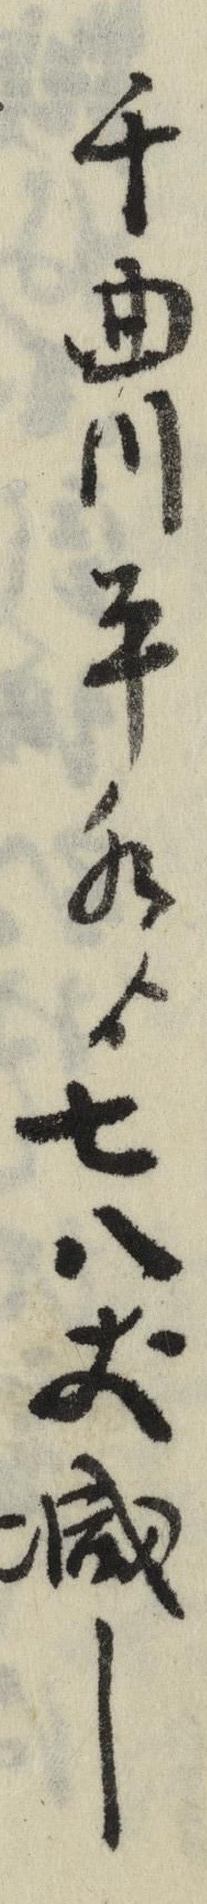千曲川平水ゟ七八尺減し
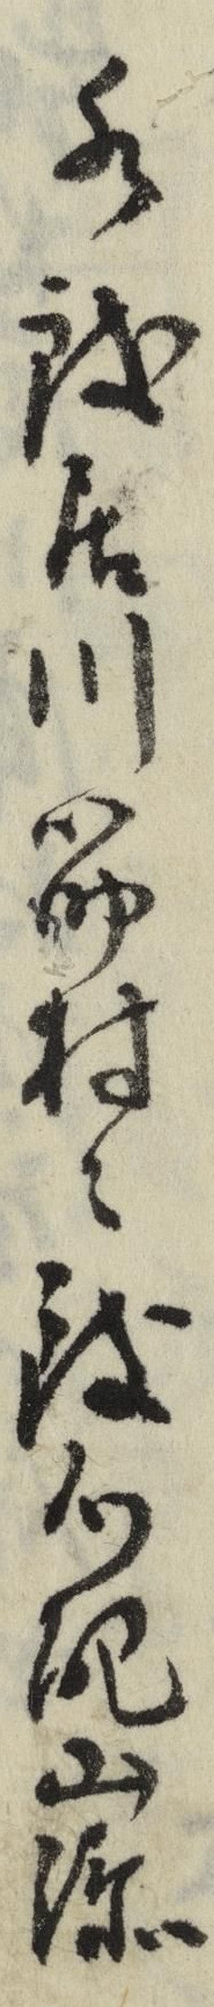水致居川筋村々致心配山添
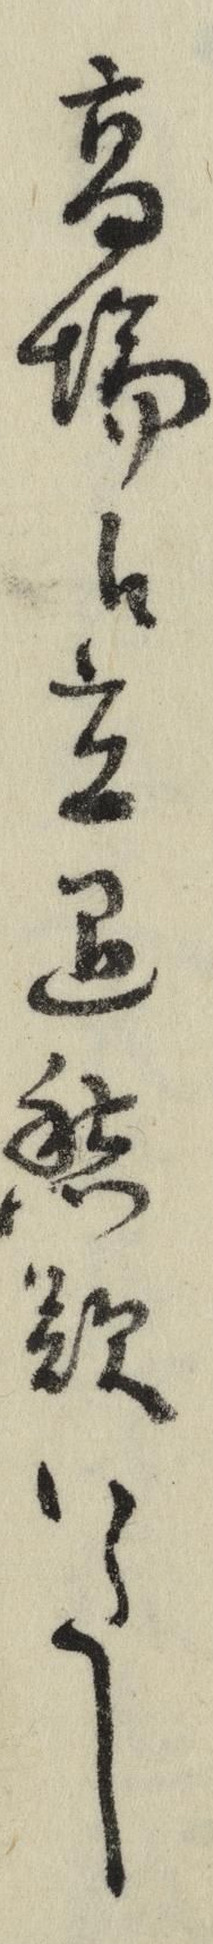高場江立退悲歎いたし
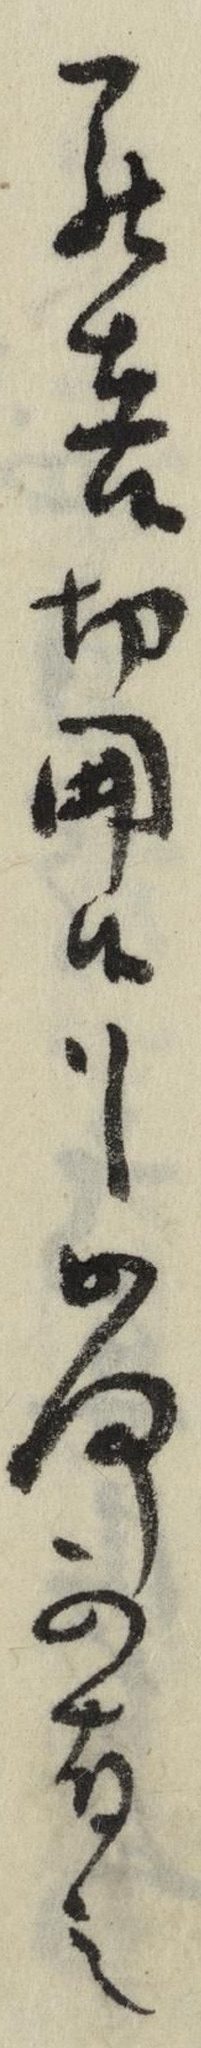罷在切開候も如何可有之
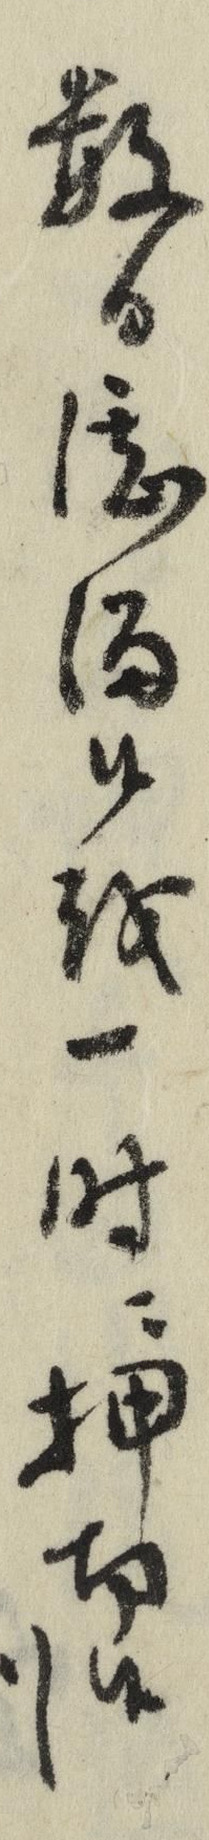数日湛留候を一時二押切候も
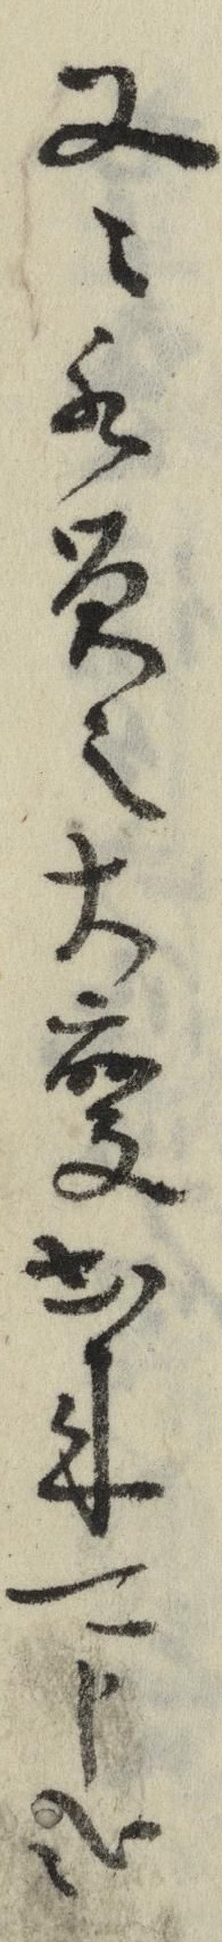又々水災之大変出来可申哉

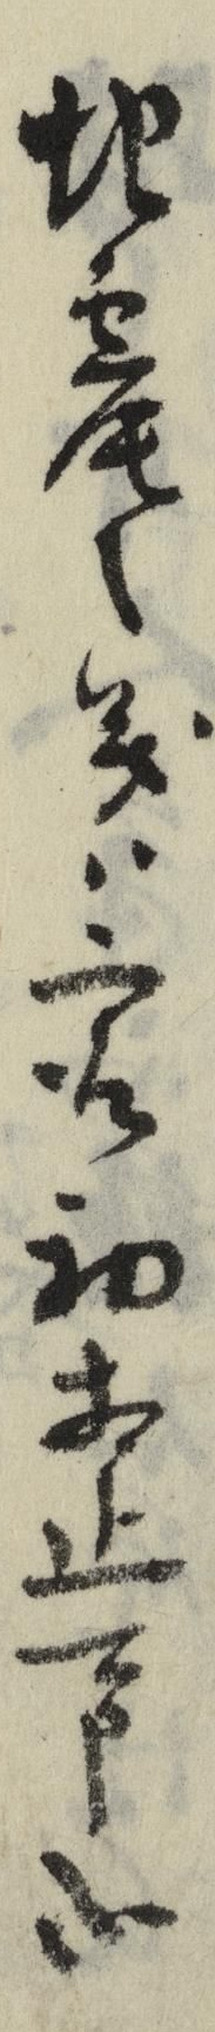地震之義は最初相止可申哉
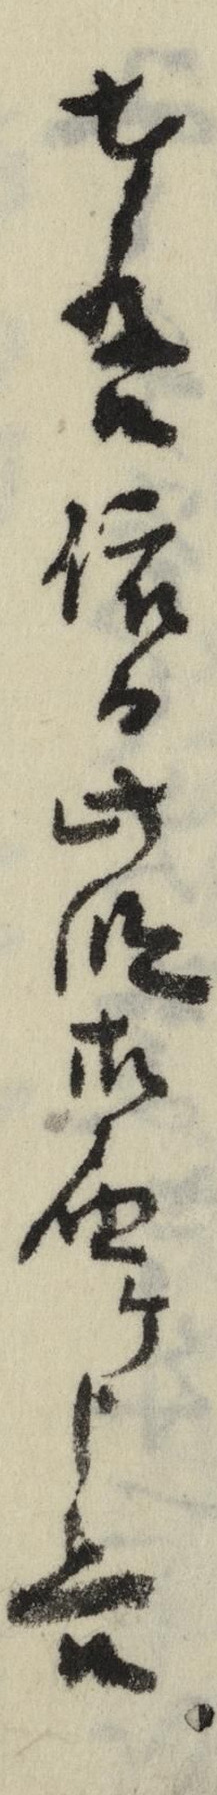奉存候依而此段御届ケ申上候以上
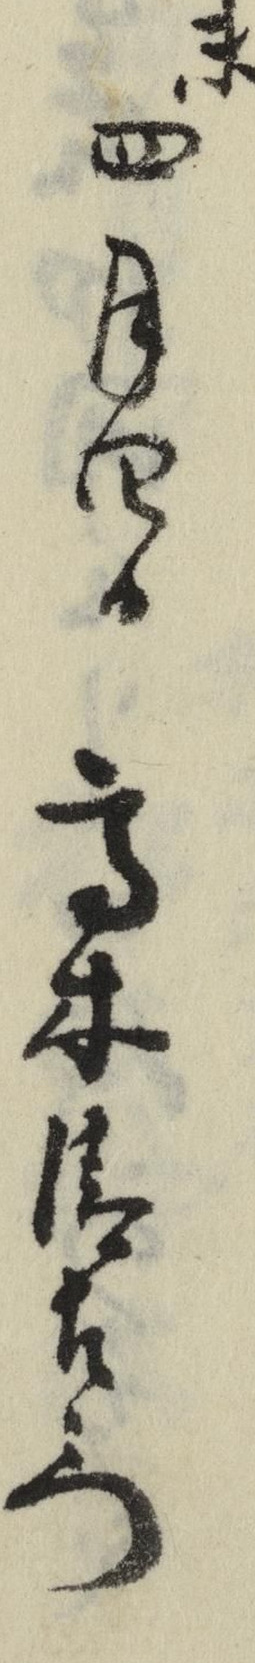未四月四日高木清左衛門
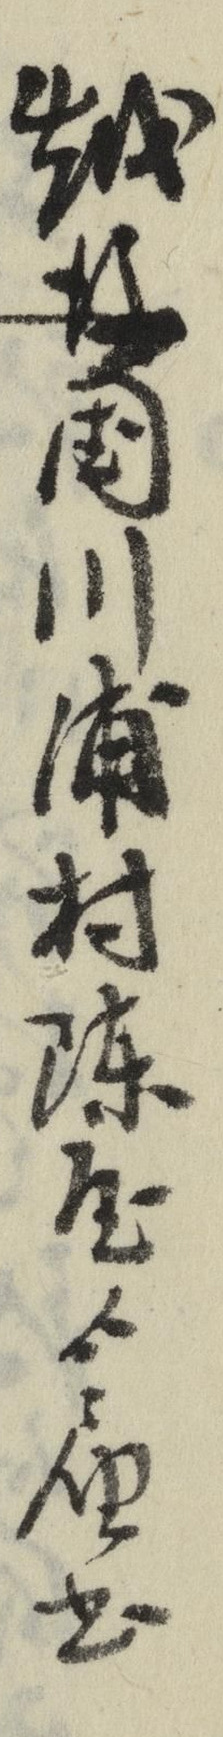越後国川浦村陣屋ゟ届書
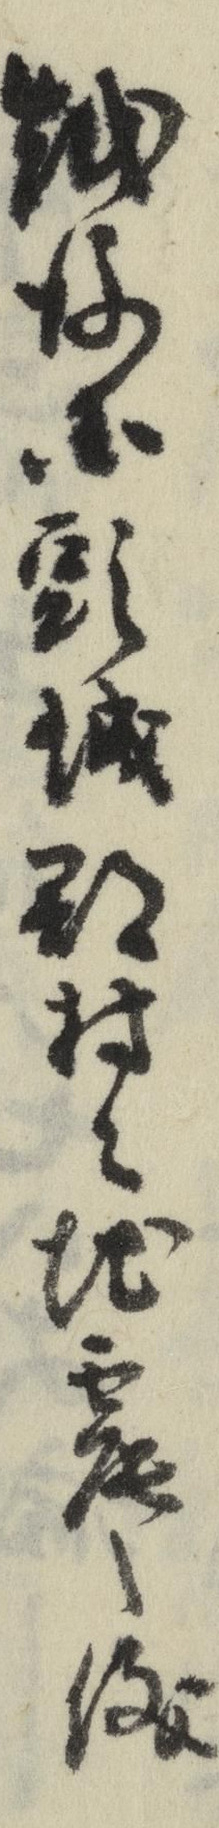越後国頸城郡村々地震之儀
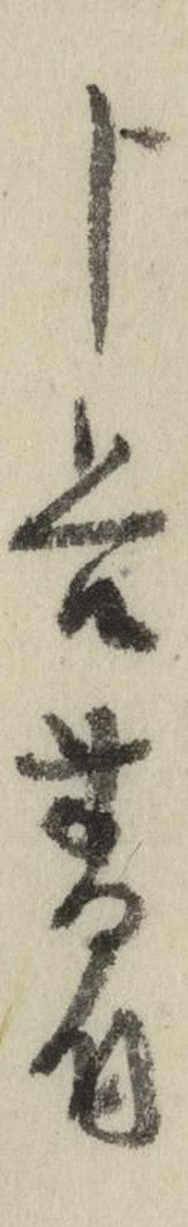申上候書付
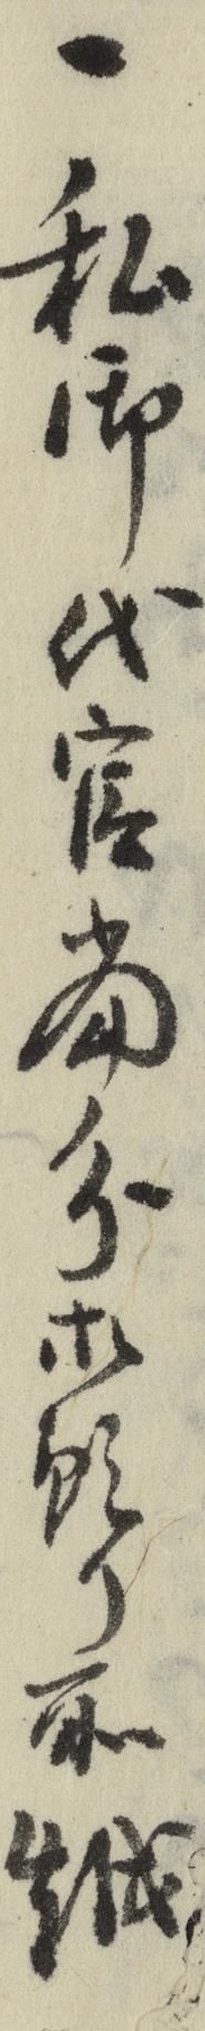一私御代官所当分御預り所越
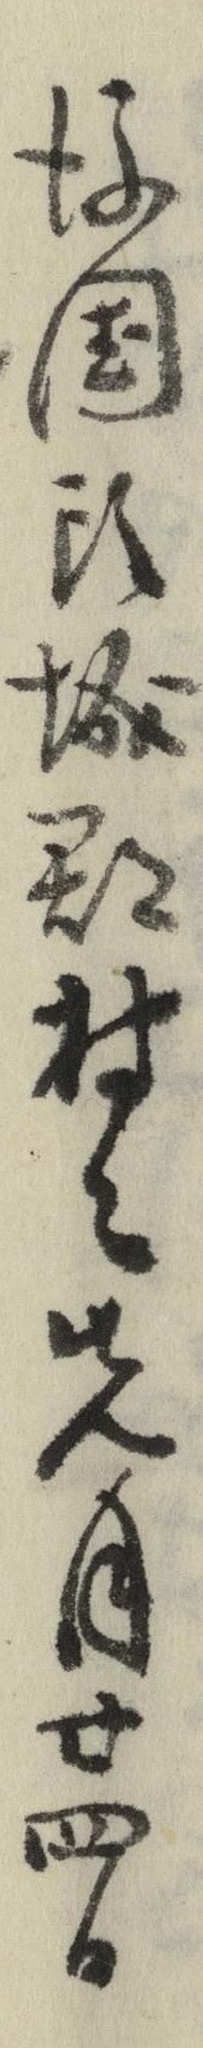後国頸城郡村々先月廿四日
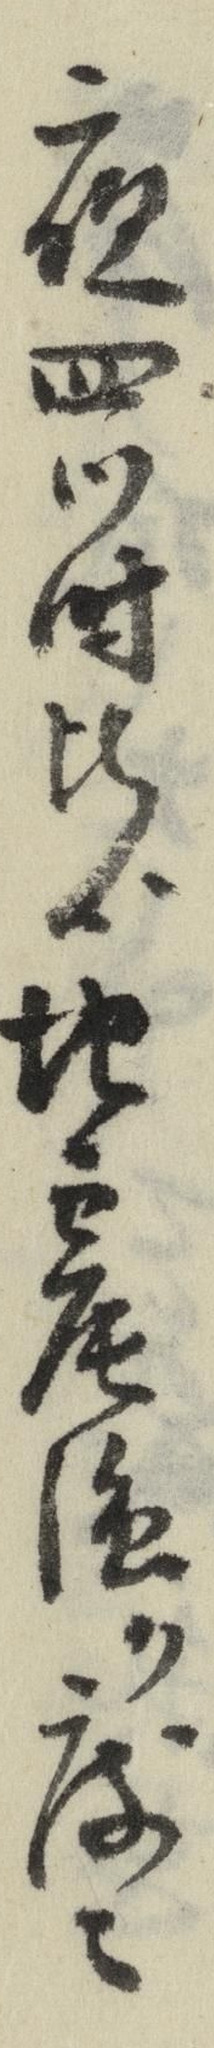夜四ツ時比ゟ地震強ク度々
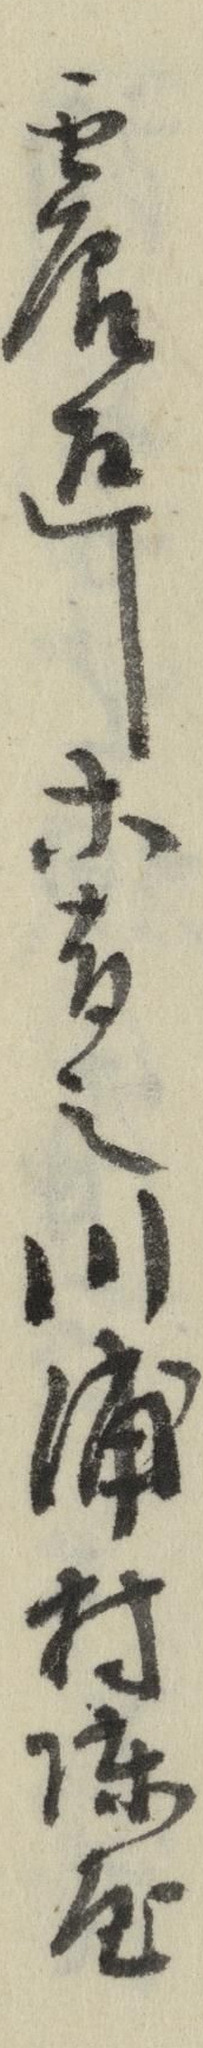震返し等有之川浦村陣屋
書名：信州大地震一件之冩　丁未弘化四年三月吉日
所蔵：東京大学地震研究所図書室 Earthquake Research Institute Library, The University of Tokyo, JAPAN
